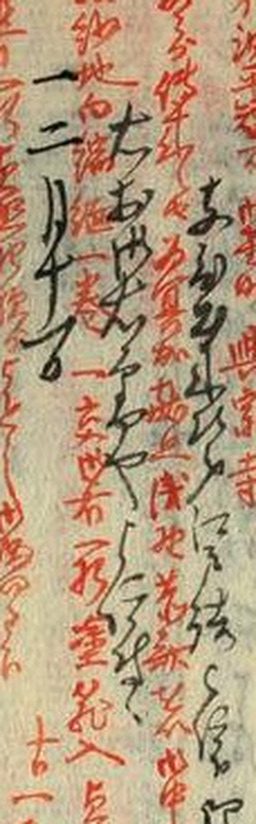右於御右筆部や被仰付候
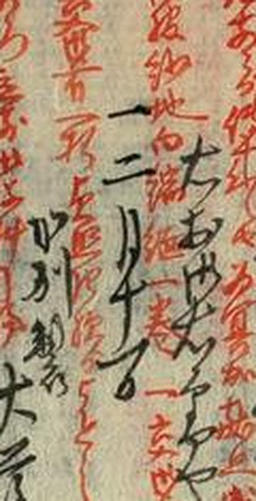一二月十一日
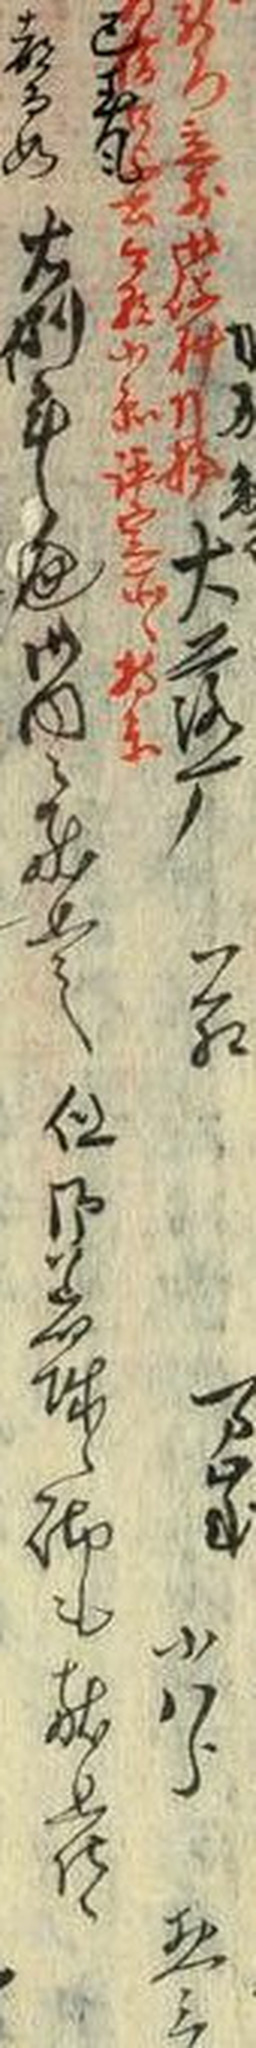右例年之通御内々献上之但御着城之砌も献上仕候
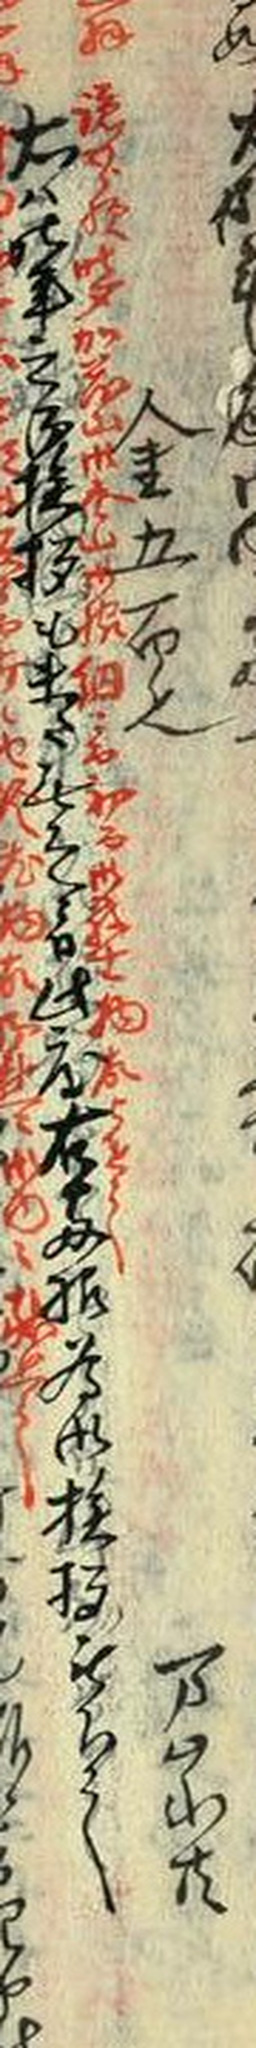右ハ昨年之御挨拶も未た無之ニ付此度右両様為御挨拶被下之
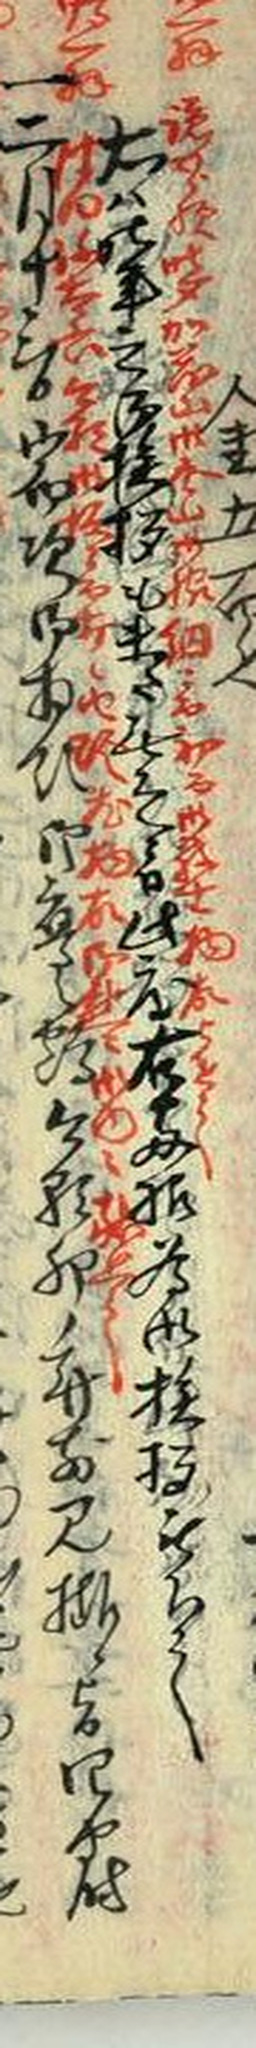一二月十三日宿次御拝領御鷹之鶴今朝卯之刻前見掛候旨四半時
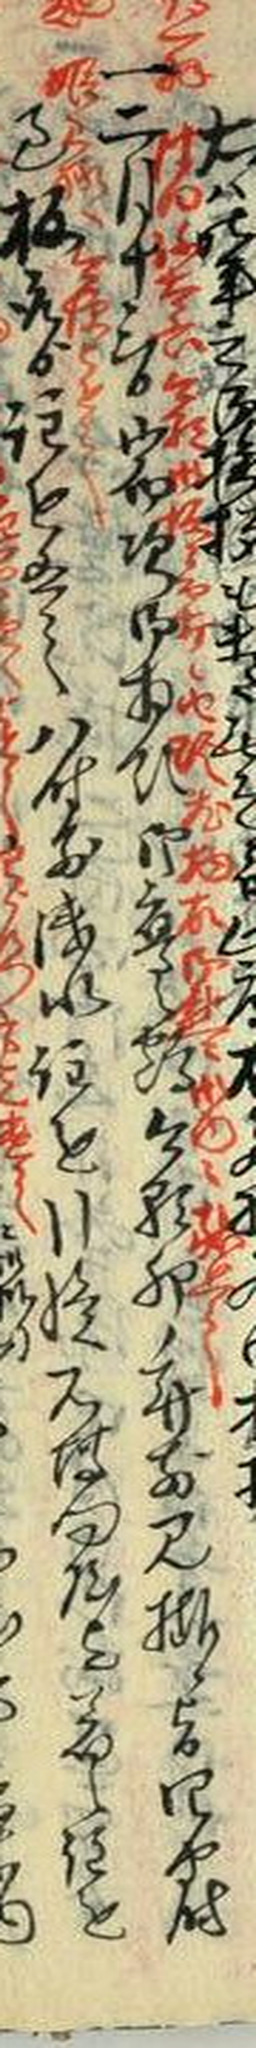過板取ゟ注進有之八時前浅水注進引続石場問屋迄着之注進
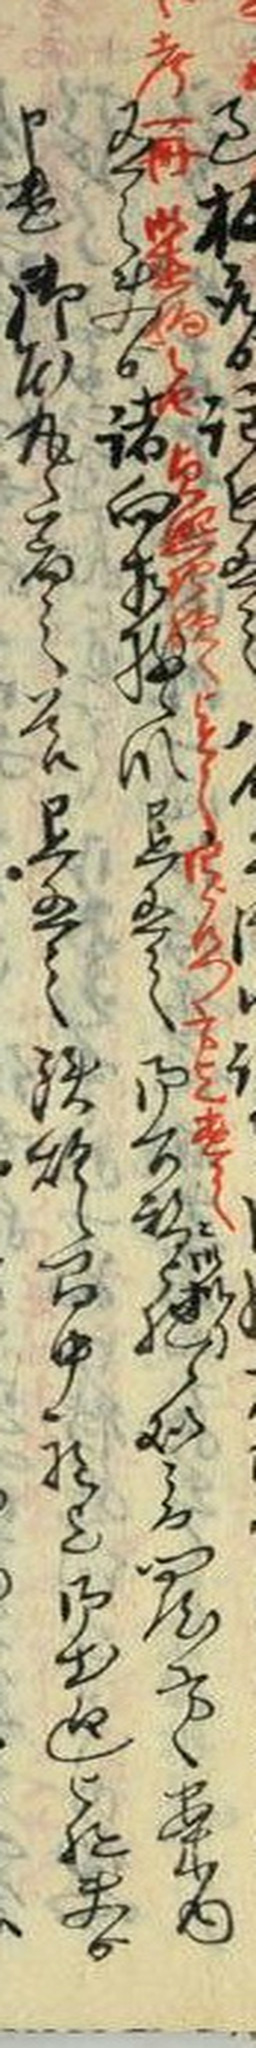申遣御本丸へ着之節申上有之鉄炮之間中程迄御出迎被遊夫ゟ
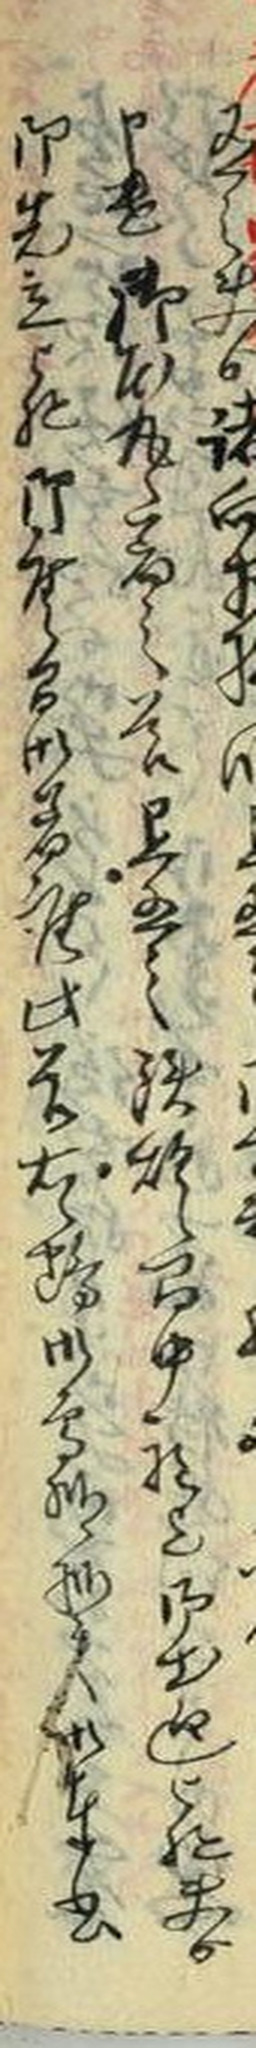御先立被遊御座之間御着座此節右之鶴御鳥掛へ掛之御奉書
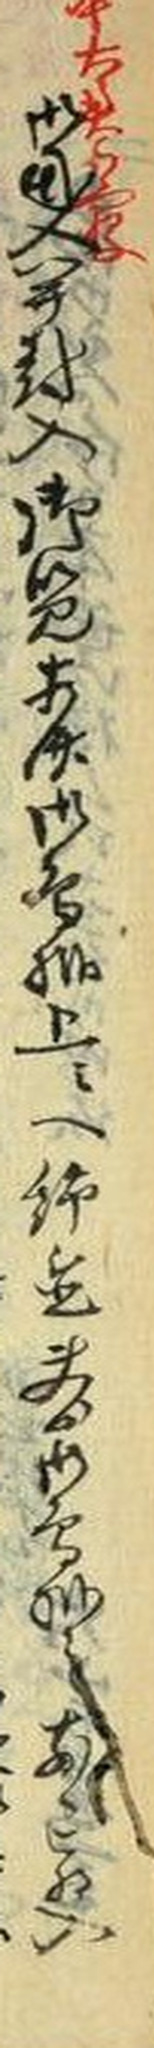御用人開封入御覧相済御鳥掛上ミへ飾置夫ゟ御鳥掛之前へ被為入
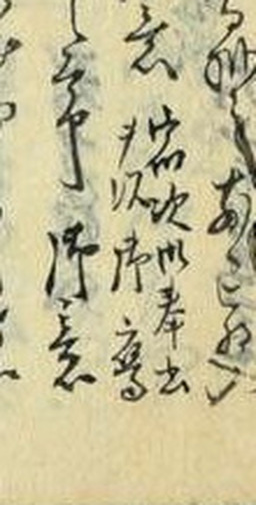ヲ以御鷹
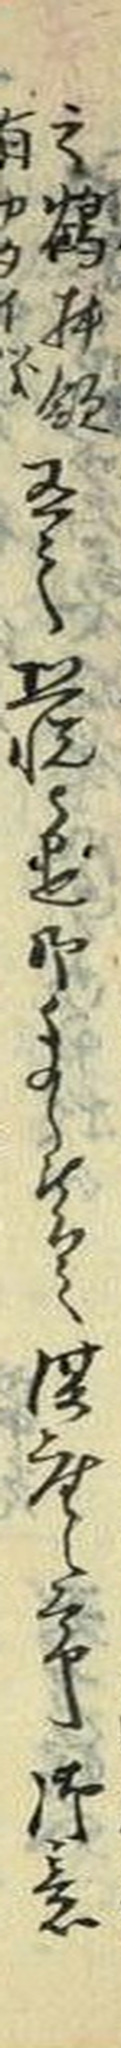有カタイ儀有之恐悦被申上御手のし被下之復座之節御意
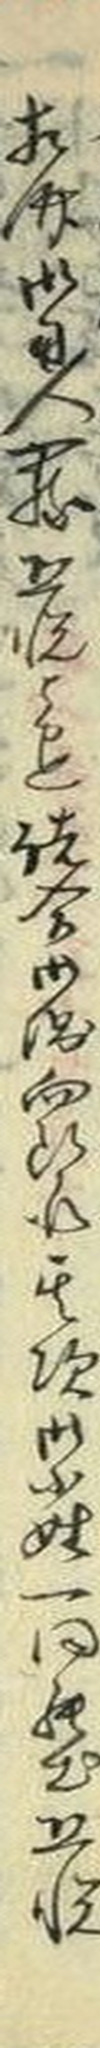相済御用人一統恐悦被申上詰合御側向頭取其次御小姓一同罷出恐悦
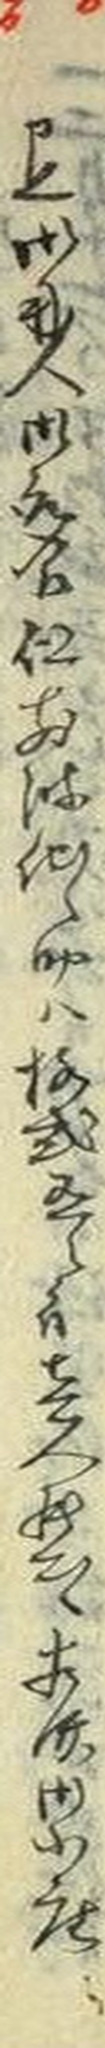申上御用人御取合但前波他之助ハ格式有之候ニ付壱人罷出候相済御小座
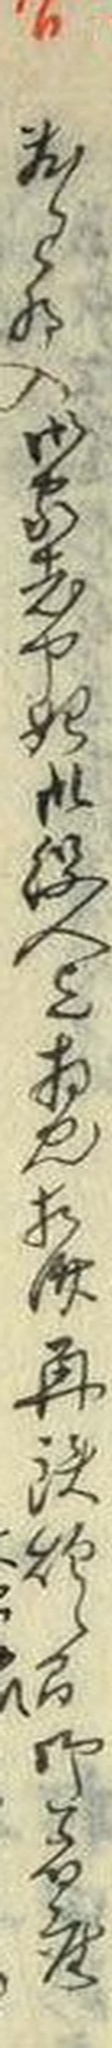敷へ被為入御家老中始御役人迄拝見相済再鉄炮之間御着座
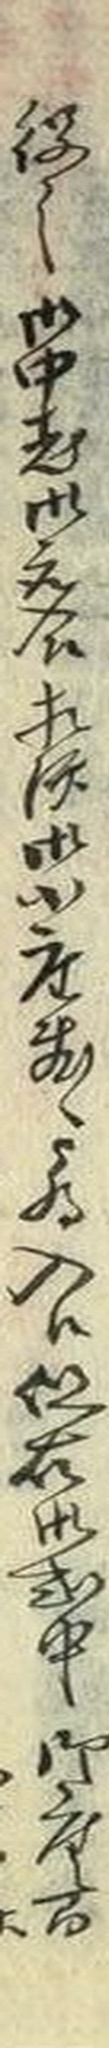役之御中老御取合相済御小座敷へ被為入候但右御式中御座之間
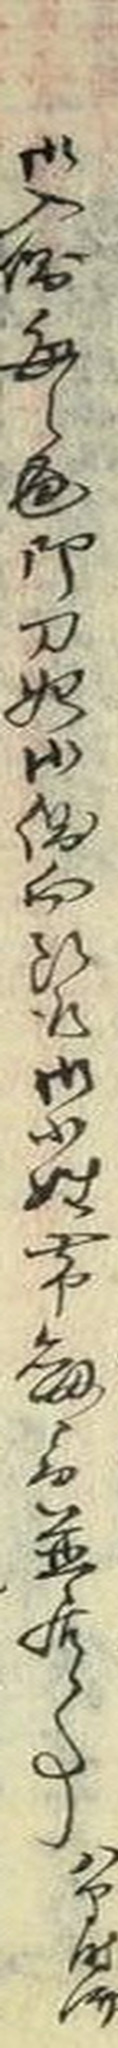御入側毎之通御刀始御側向頭取御小姓帯剣ニ而並居候事八半時済
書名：少傅日録抄（斉承付側向頭取日記、在国）
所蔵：福井県文書館 Fukui Prefectural Archives
